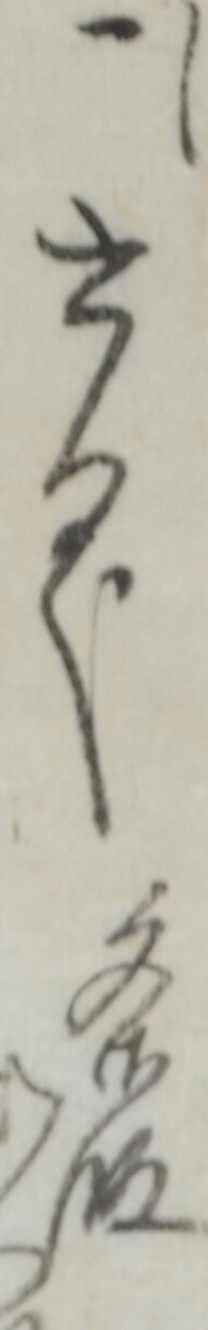一六百文夕御飯
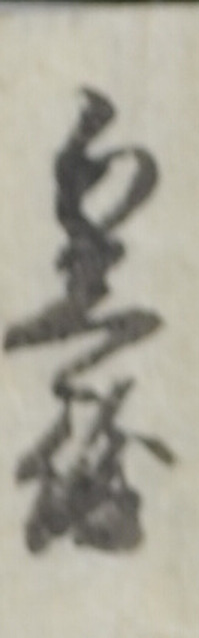白壱崎
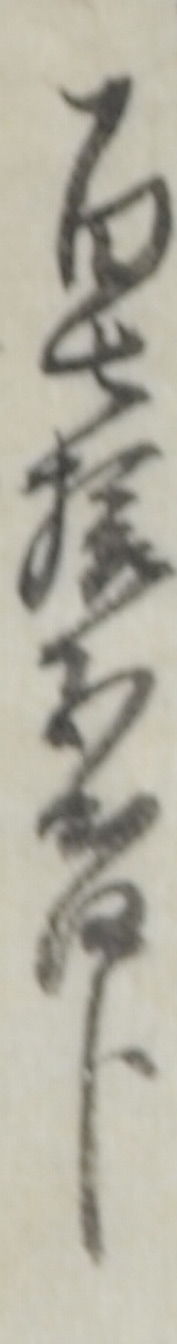〆百七拾五匁四分

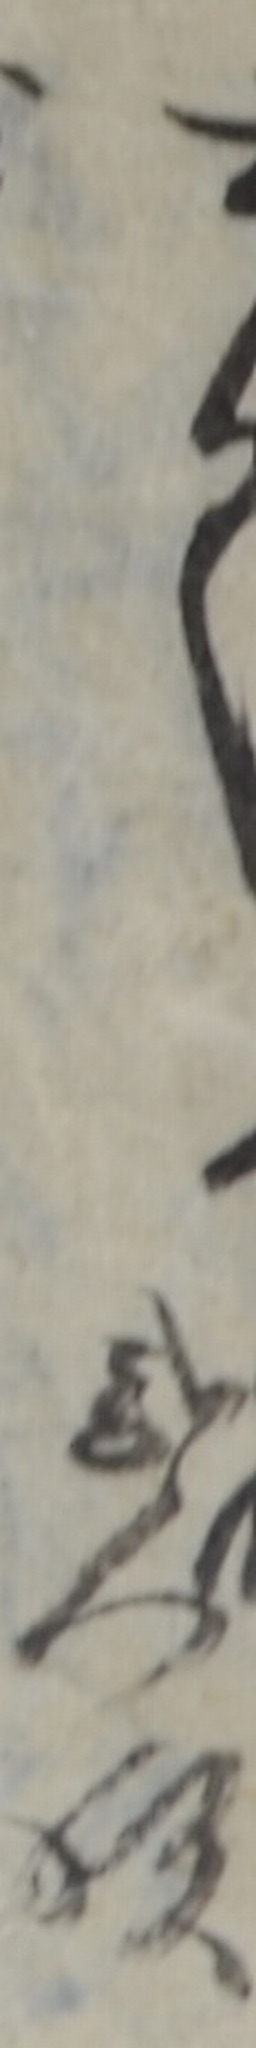弐人様
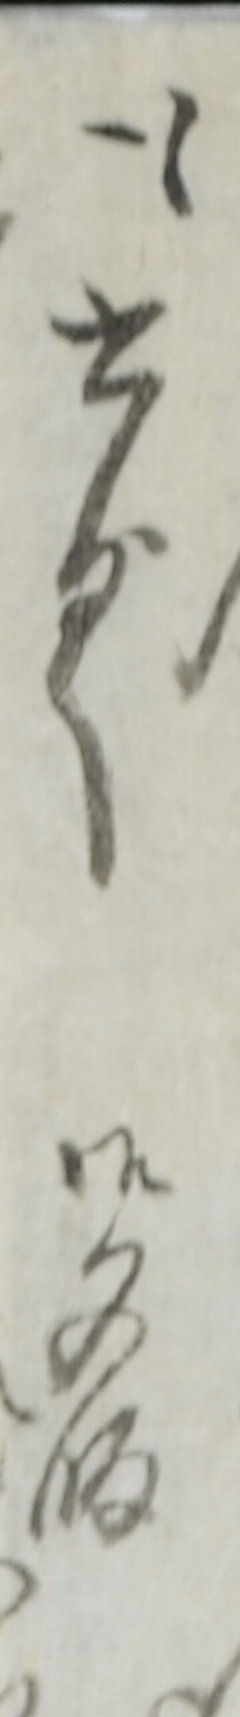一六百文御夕飯
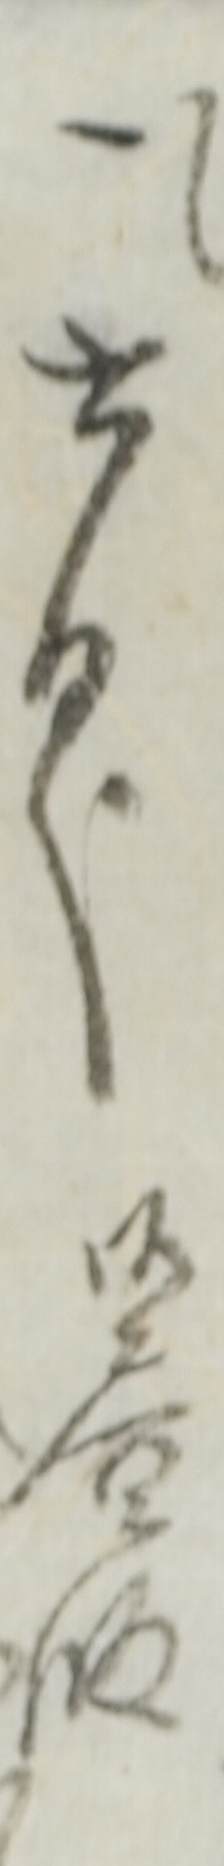一六百文御昼飯
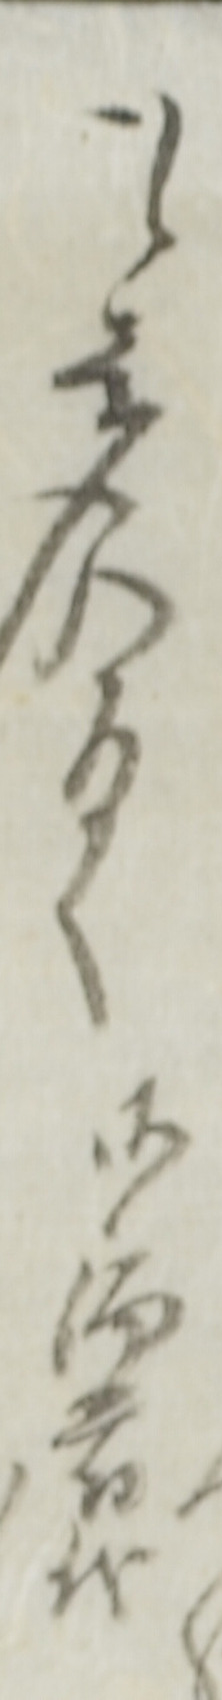一壱貫八百文御酒肴代
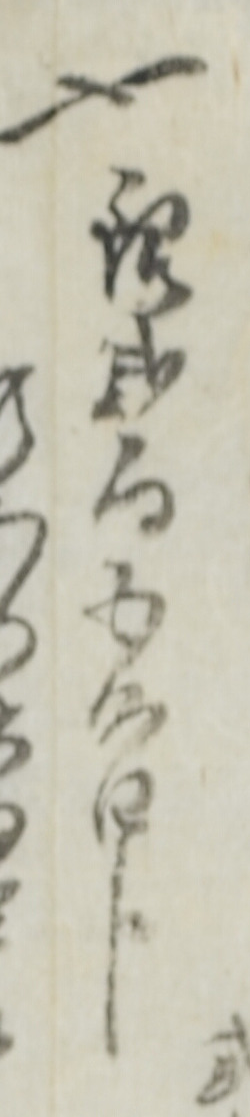〆銀弐百五匁四分
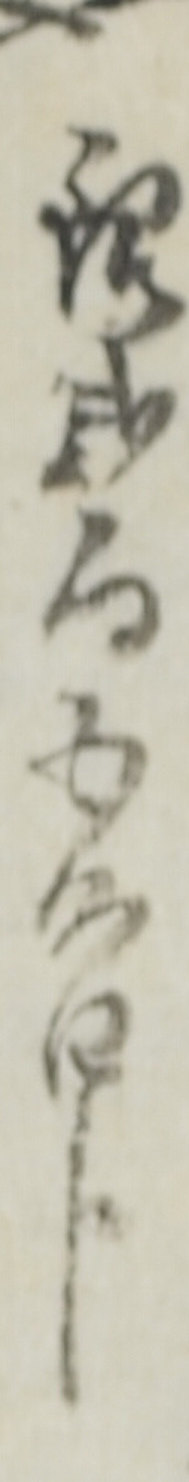〆銀弐百五匁四分
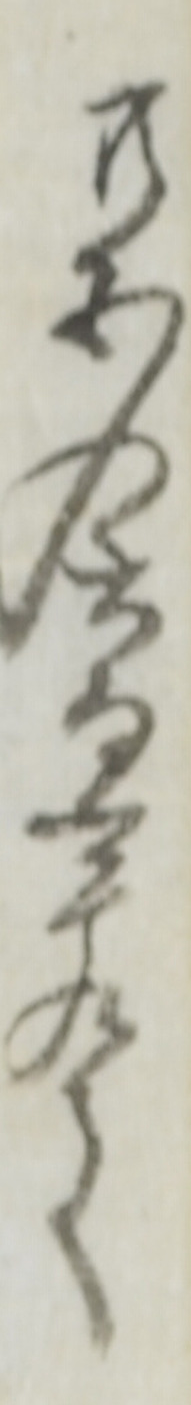廿五貫六百六十九文
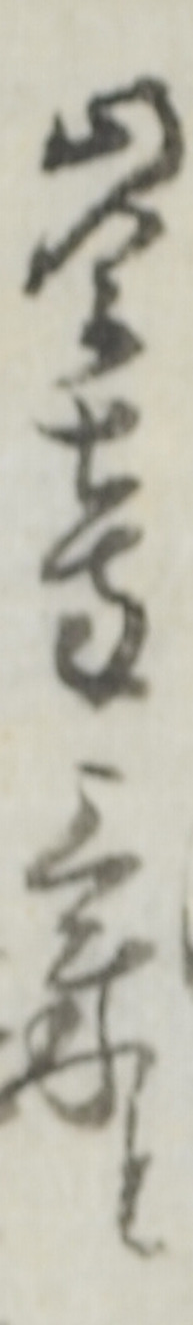此金七両三朱と
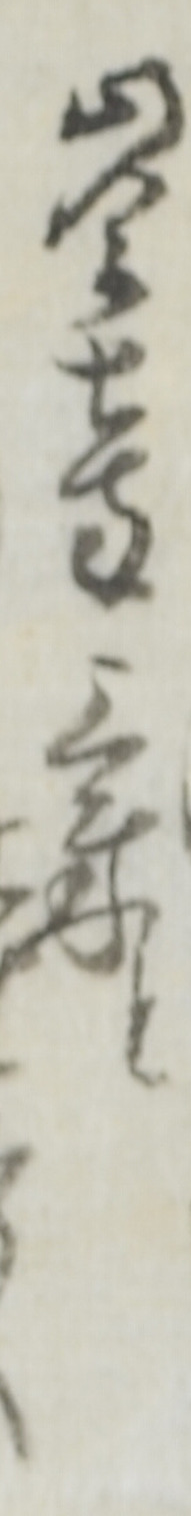此金七両三朱と

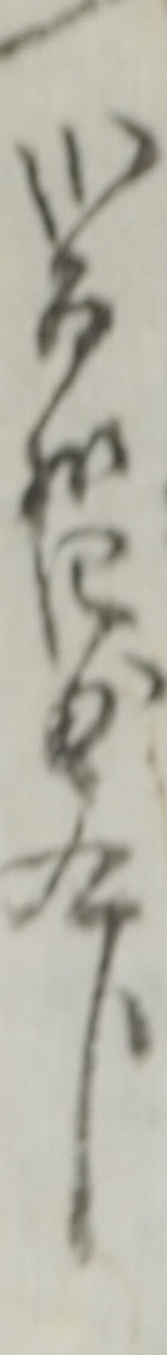弐百拾四匁九分
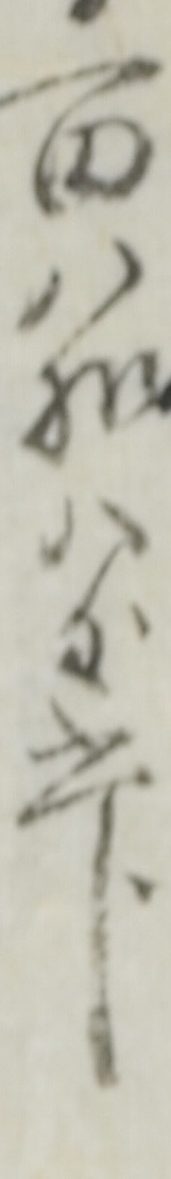百八拾八匁六分
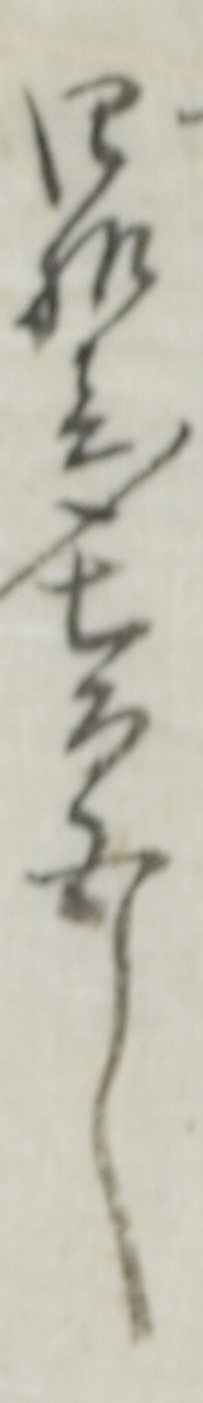四拾壱貫七百五文
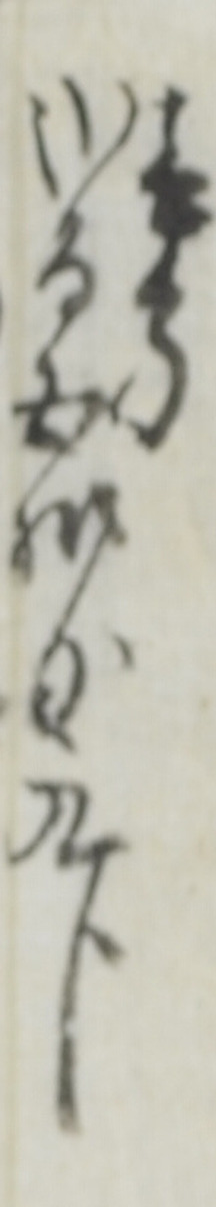弐百拾四匁九分
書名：（金銭書上控）
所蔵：伊那市立高遠町図書館・合同会社AMANE
